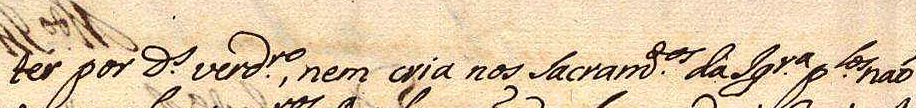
ter por D.s verd.ro, nem cria nos Sacram.tos da Igr.a p.los naõ
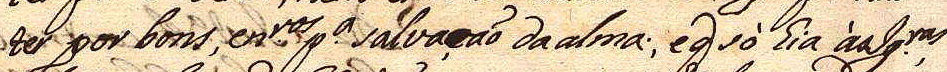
ter por bons, en.ros p.a salvaçaõ da alma; e q̄ só hia às Ig.ras,
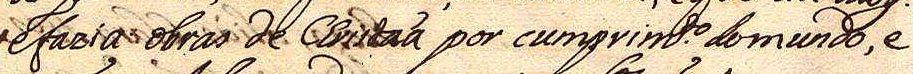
e fazia obras de Christaã por cumprimt.o do mundo, e
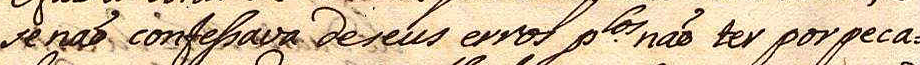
se naõ confessava de seus erros p.los naõ ter por peca
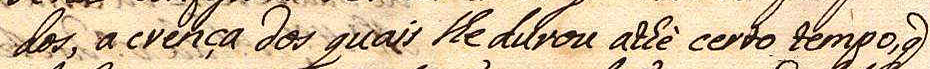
dos, a crença dos quais lhe durou athè certo tempo, q̄
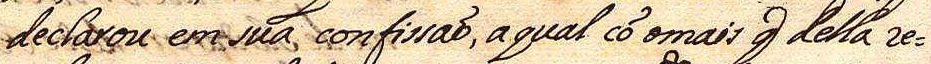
declarou em sua confissaõ, a qual cō o mais q̄ della re
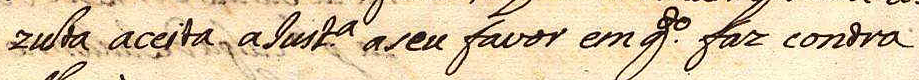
zulta aceita a Iust.a a seu favor em q̄ faz contra
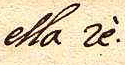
ella ré.
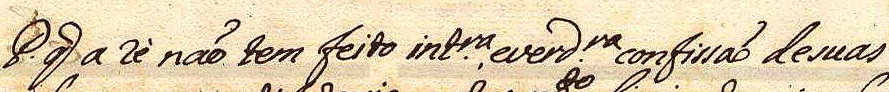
P. q̄ a ré naõ tem feito int.ra, e verd.ra confissaõ de suas
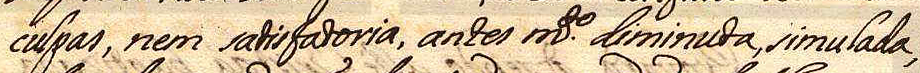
culpas, nem satisfatoria, antes m.to diminuda, simulada,
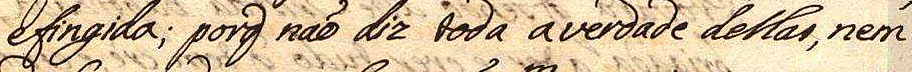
e fingida; porq̄ naõ diz toda a verdade dellas, nem
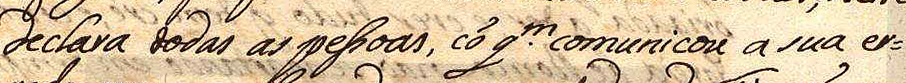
declara todas as pessoas, cō q.m comunicou a sua er
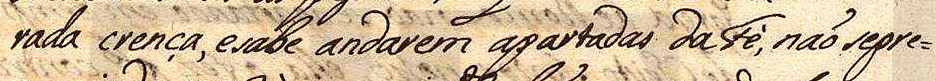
rada crença, e sabe andarem apartadas da Fè, naõ se pre
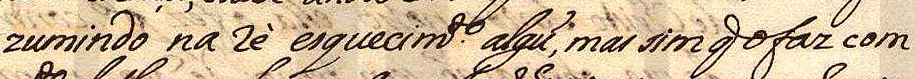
zumindo na Rè esquecim.to algū, mas sim q̄ o faz com
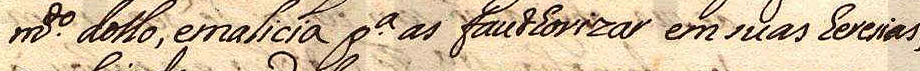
m.to dollo, e malicia p.a as fauthorizar em suas heresias,
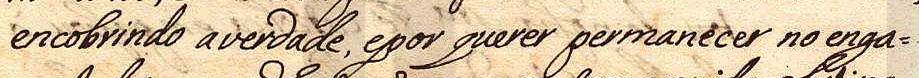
encobrindo a verdade, e por querer permanecer no enga
